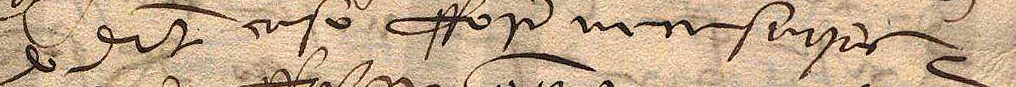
do dito caso fforē necesarjas e
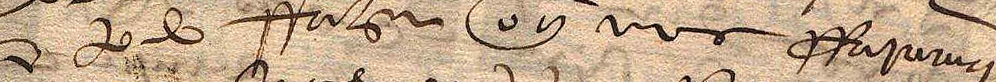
ē todo ffazer o q̄ nos ffariamꝯ
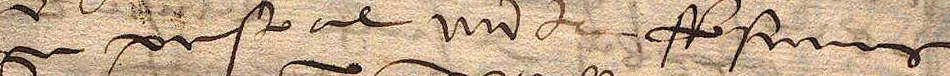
se pesoalmēte ffosemos
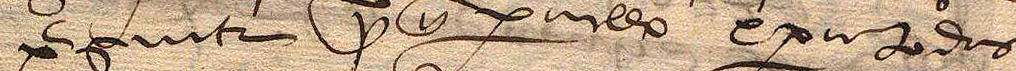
p̄sente p̄oq̄ ꝑa ello e ꝑa todas
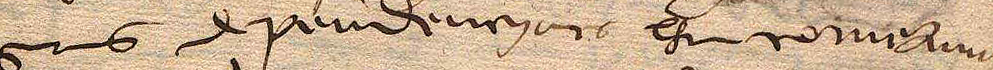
suas dependencyas lhe cometemꝯ
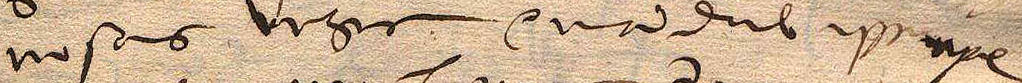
nosas vezes e mādado especjal
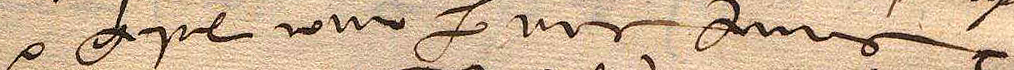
e geral como ho nos temos e
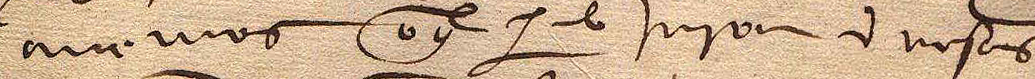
auemos o q̄l Ldo Jurou ē nosas
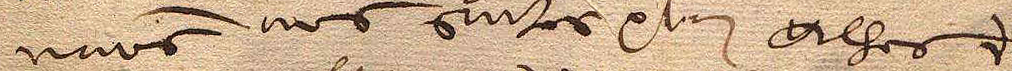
maõs aos santos evamgelhos ē
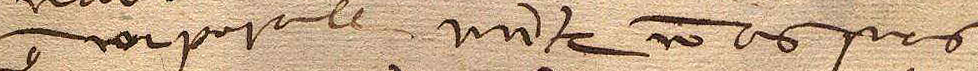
q̄ corporallmēte c̄o as suas
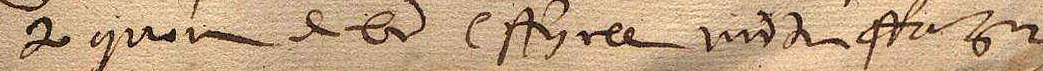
toquou de bē e ffyellmēte ffazer
